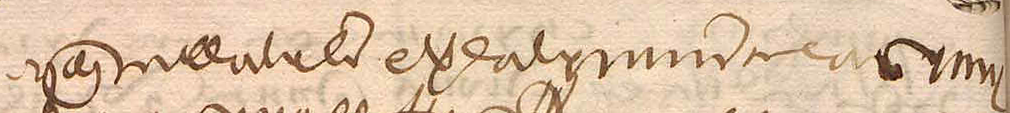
o q̄ll trelladey bē e ꝟdadeyramēte e asyney
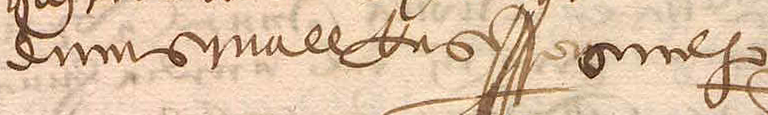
de meu synall Raso Jorge coelho
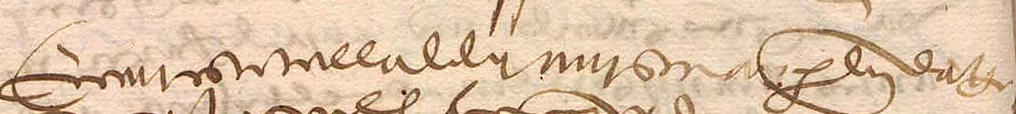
E com este trellado dey a ujsta ao ꝑdor da Re
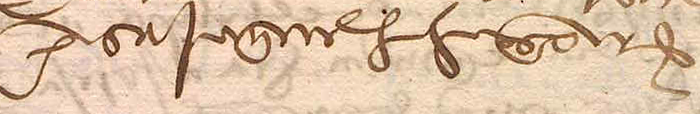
p̄sa Jorg coelho ho esp̄vy
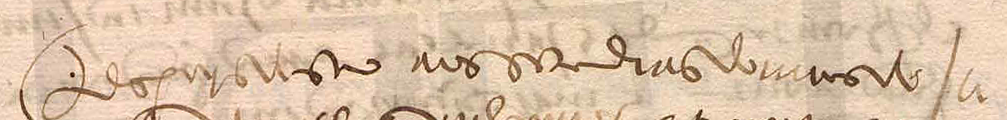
E despoys desto aos sete dias do mes de Ju
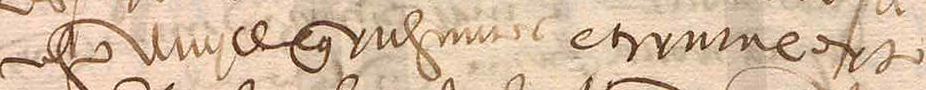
nho de mjll e q̄ynhemtos e trynta e oyto
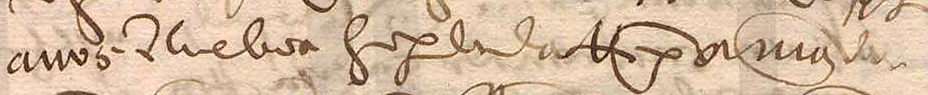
anos ē lixboa ho ꝑdor da Re p̄a mādou
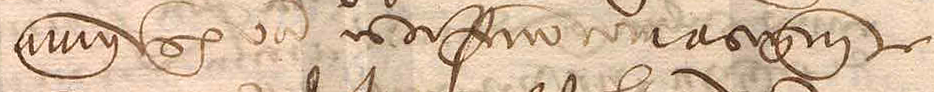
a mȳ esp̄vā este feito com a seguj̄te
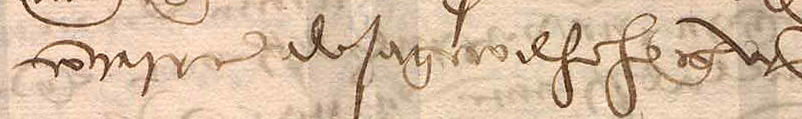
cōtraryedade Jorge coelho ho esp̄vy
